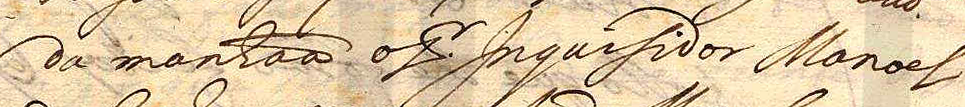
da manhāa o s.r Jnquisidor Manoel
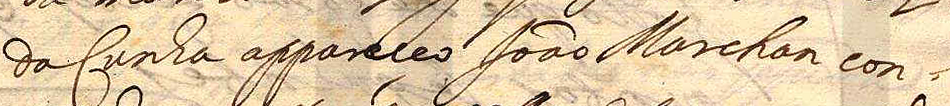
da Cunha appareceo Joaõ Marchan con
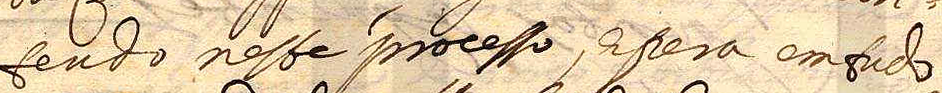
teudo neste processo, E pera em tudo
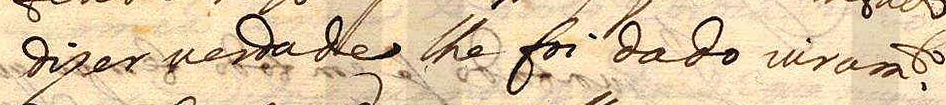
dizer uerdade lhe foi dado iuramto
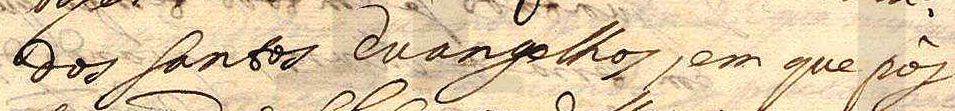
dos santos euangelhos, em que pos
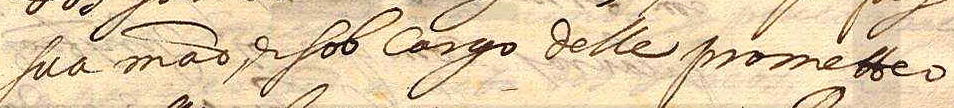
sua mão, E sob cargo delle prometteo
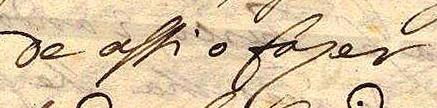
de assi o fazer
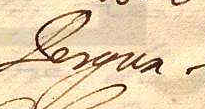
Pergun
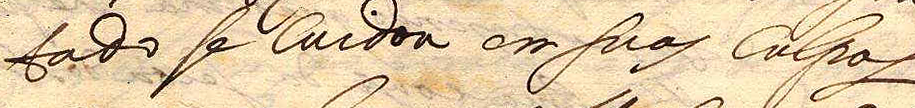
tado se cuidou em suas culpas
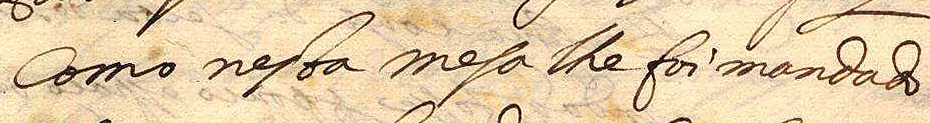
Como nesta mesa lhe foi mandado
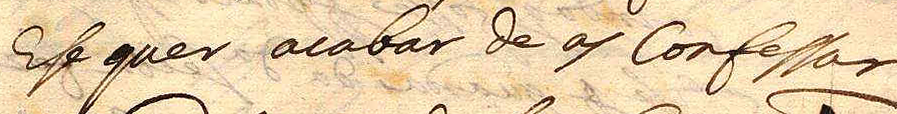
E se quer acabar de as confessar
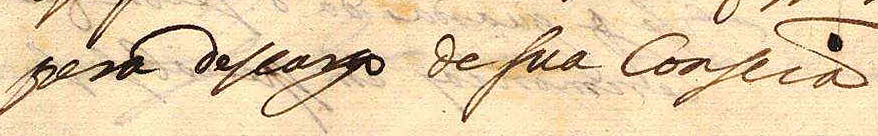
pera descargo de sua Conscīa
